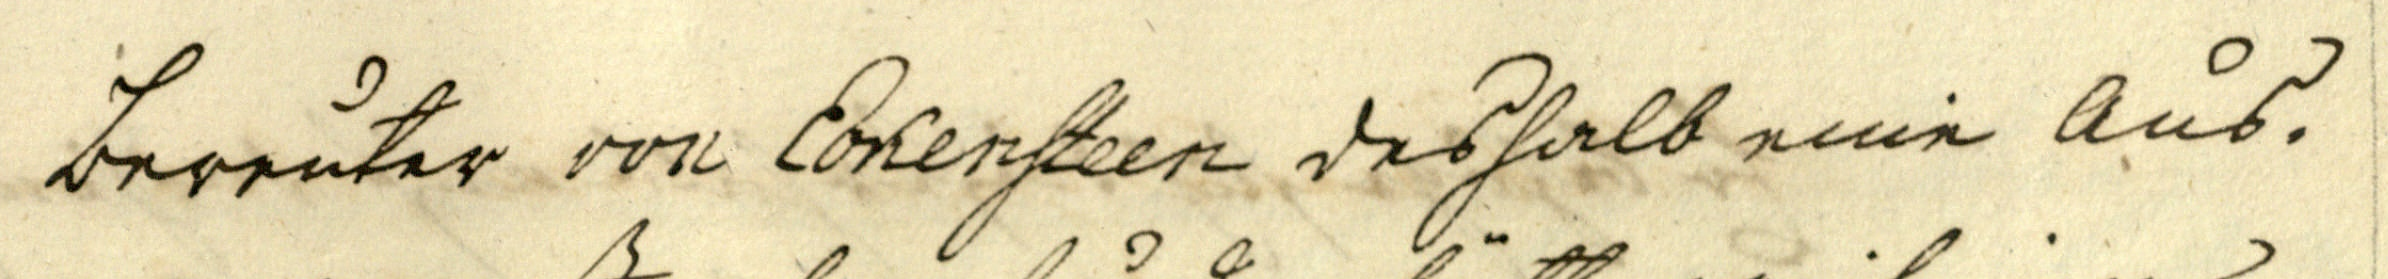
Bereuter von Eckensteen deshalb eine Aus¬
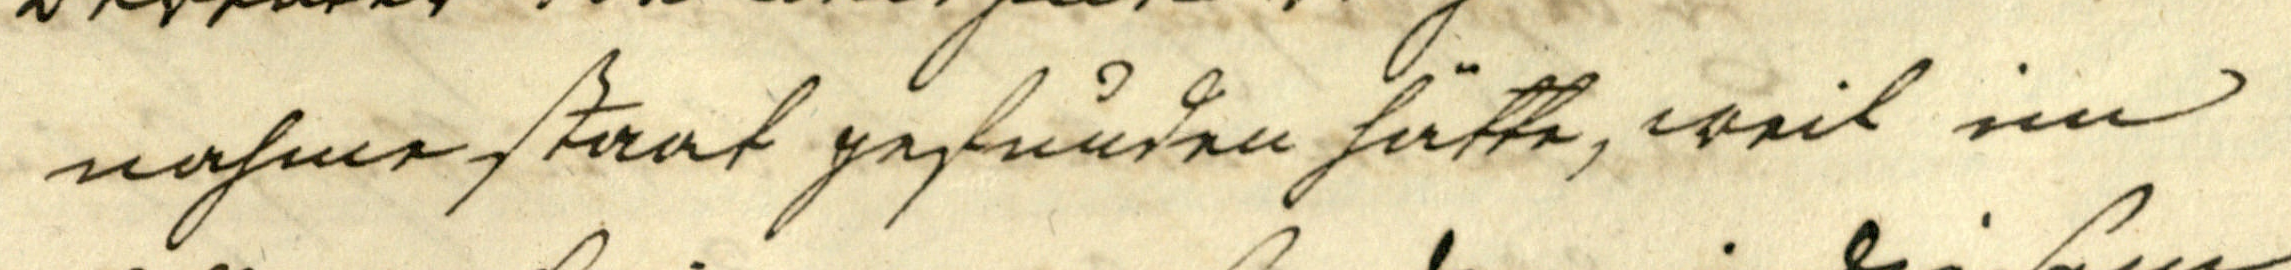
nahme staat gefunden hätte, weil im
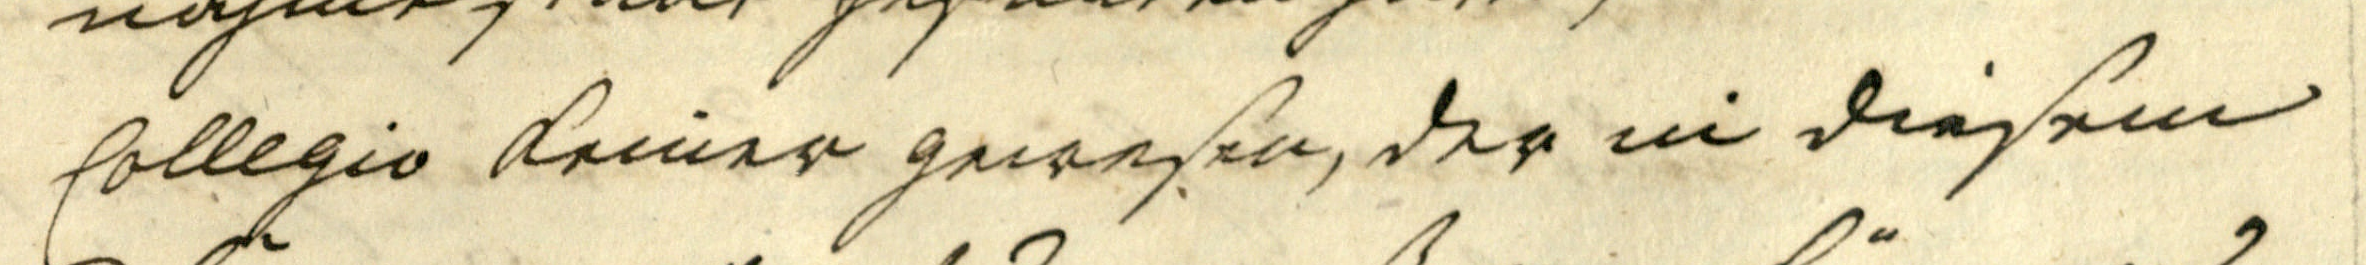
Collegio keiner gewesen, der in diesem
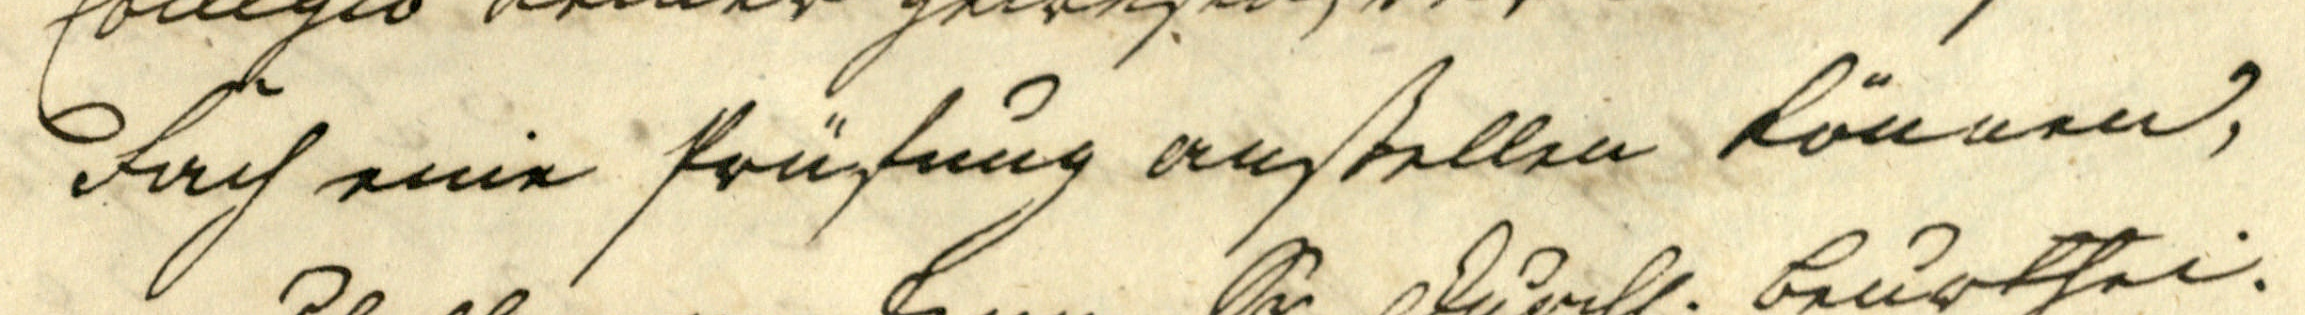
Fach eine Prüfung anstellen können,
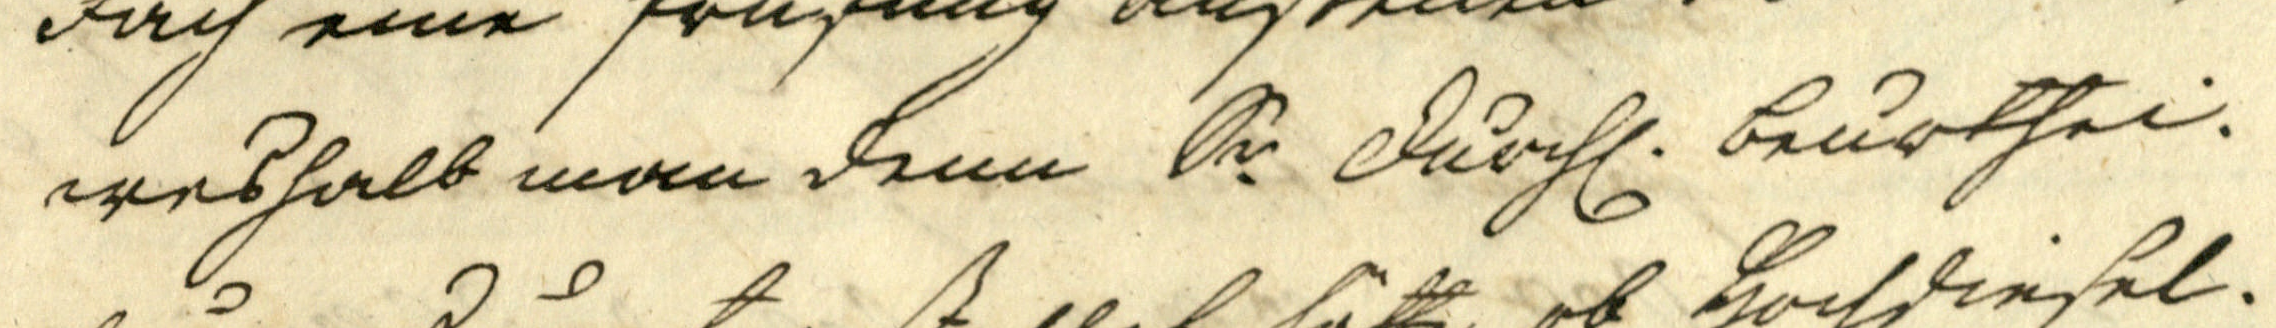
weshalb man denn Sr Durchl. Beurthei¬
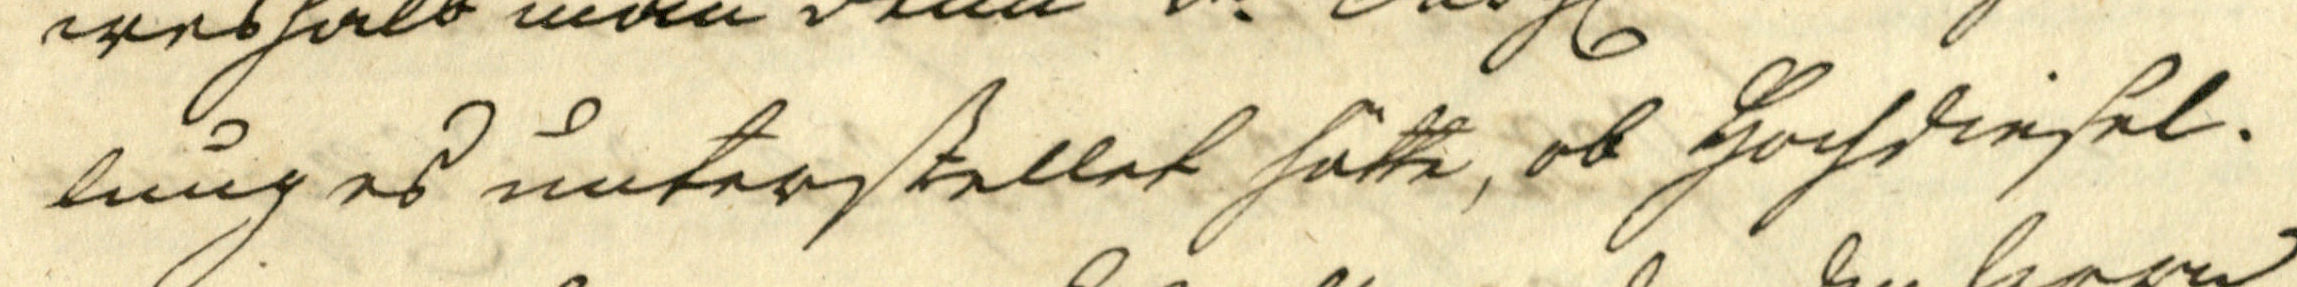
lung es unterstellet hätte, ob Hochdiesel¬
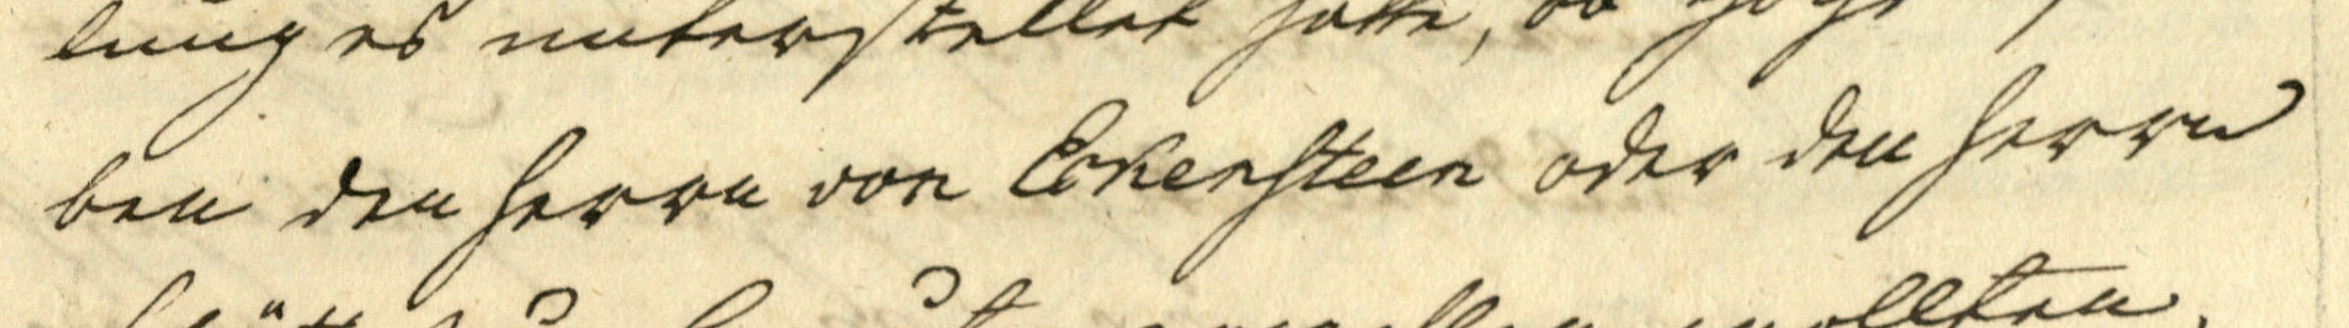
ben den Herrn von Eckensteen oder den Herrn
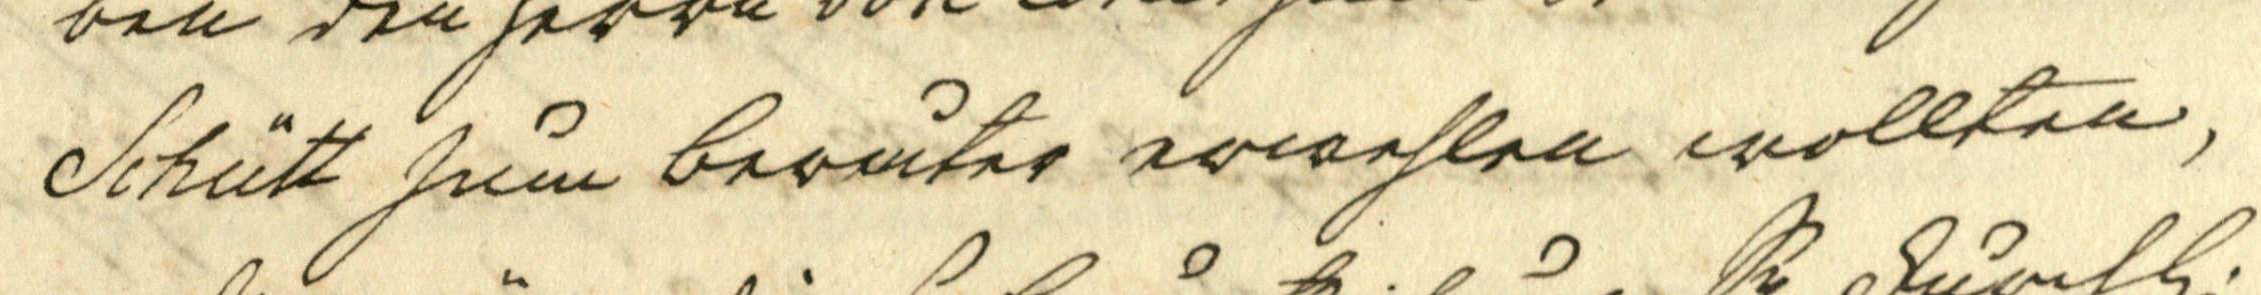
Schütt zum Bereuter erwehlen wollten,
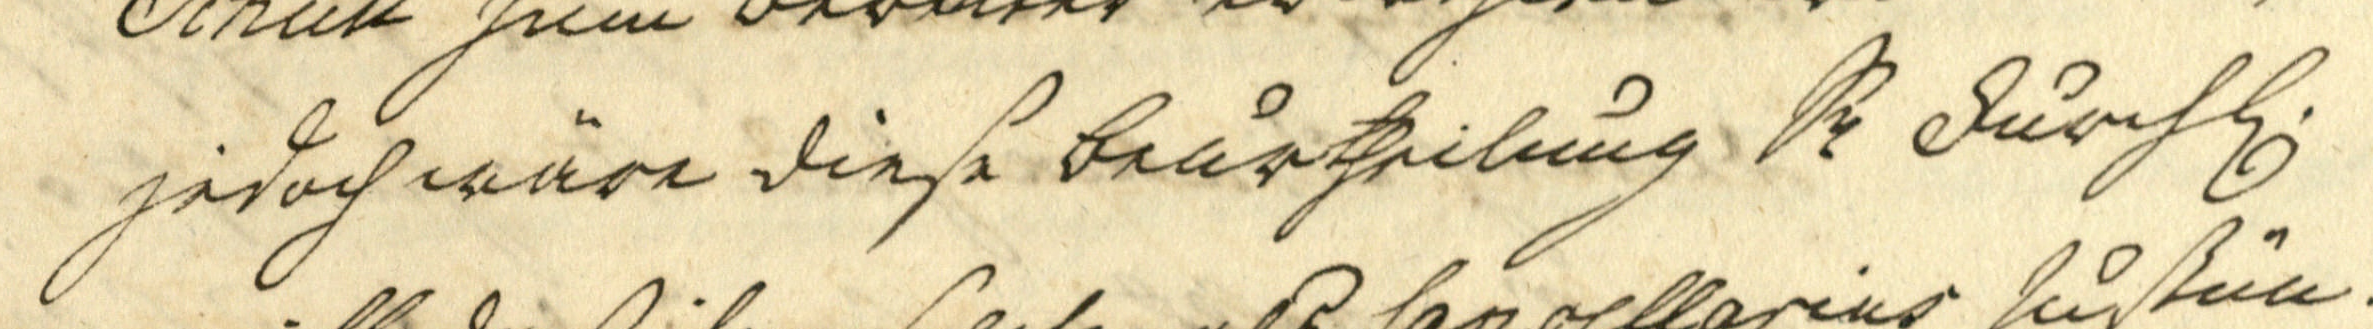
jedoch wäre diese Beurtheilung Sr Durchl.
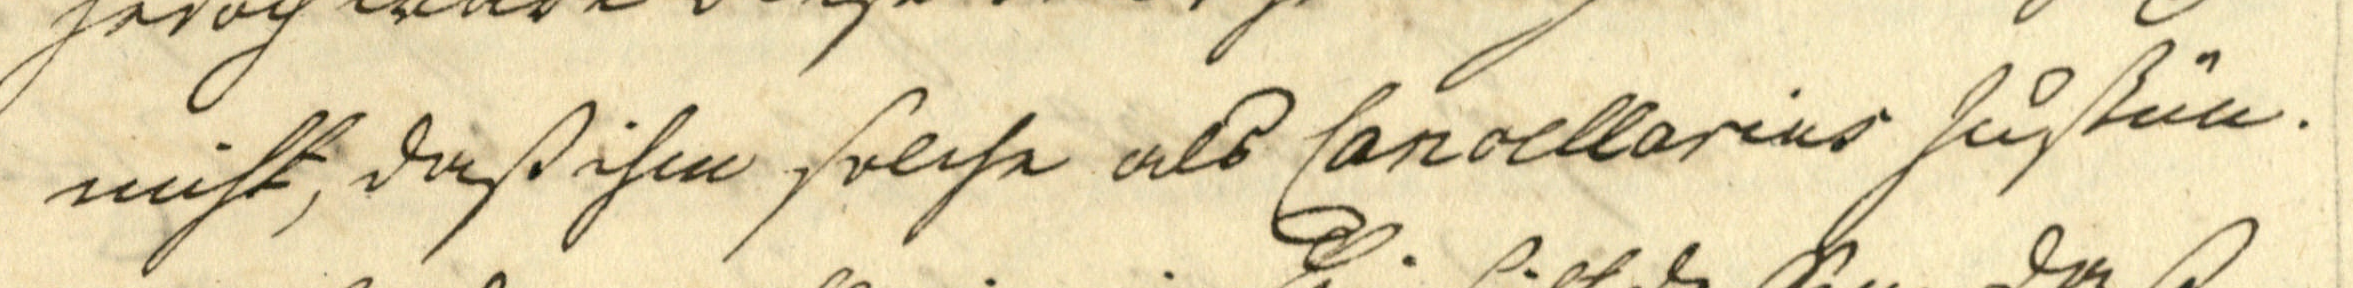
nicht, daß ihm solche als Cancellarius zustün¬
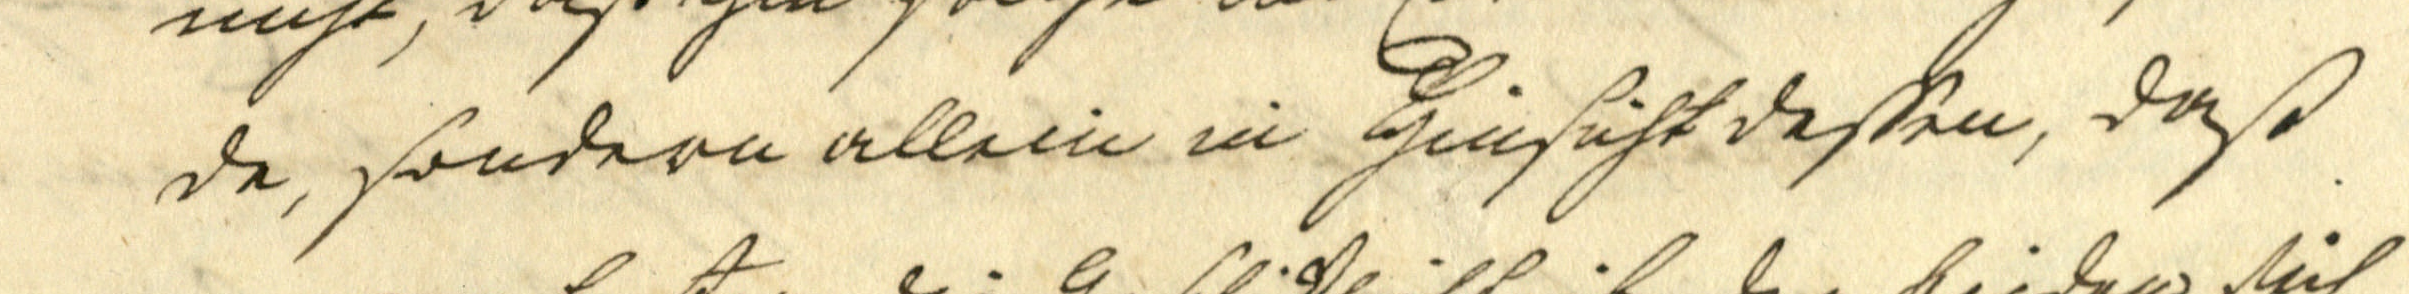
de, sondern allein in Hinsicht dessen, daß
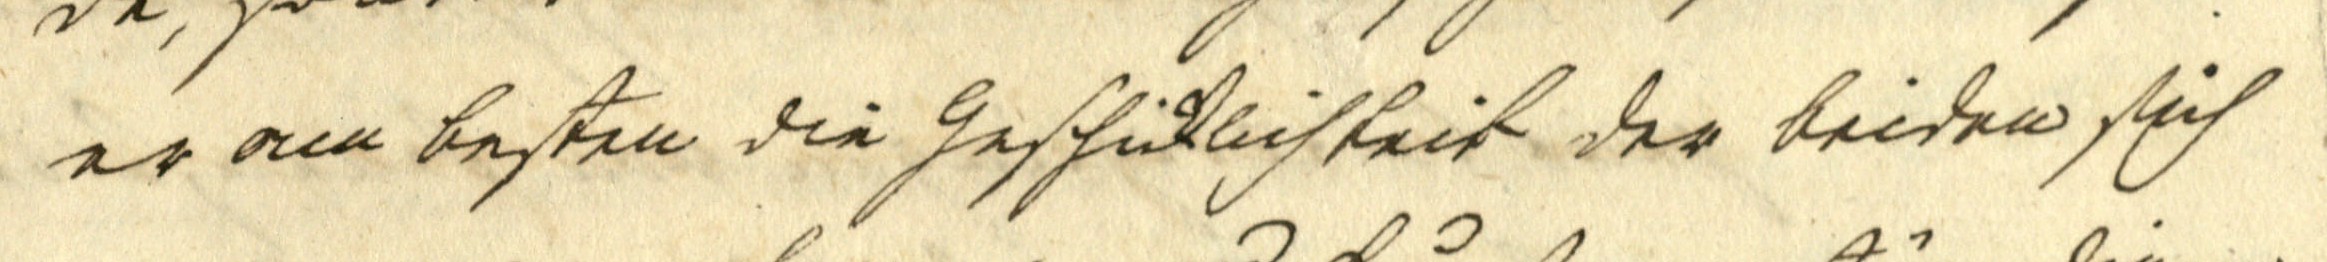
er am besten die Geschicklichkeit der beiden sich
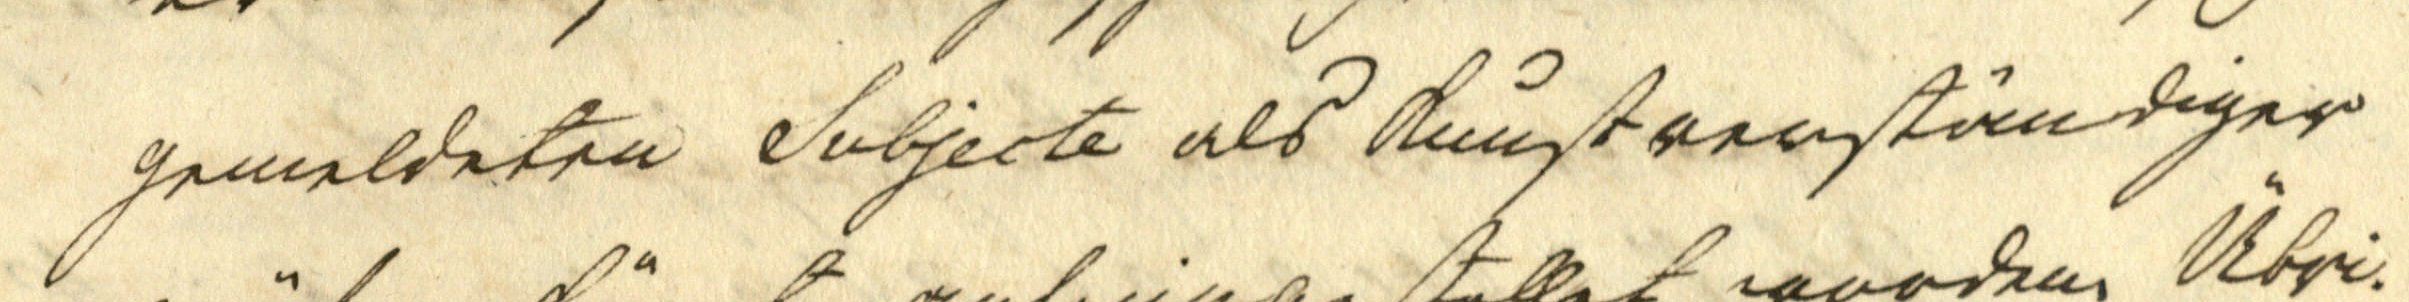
gemeldeten Subjecte als Kunst verständiger
